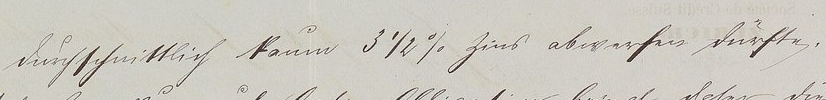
durchschnittlich kaum 3½% Zins abwerfen dürfte.
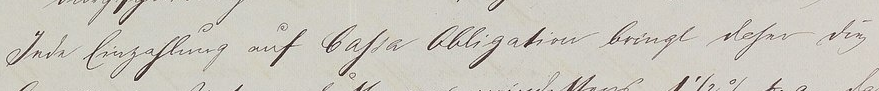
Jede Einzahlung auf Cassa Obligation bringt daher die
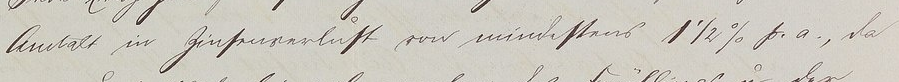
Anstalt in Zinsenverlust von mindestens 1½% p. a., da
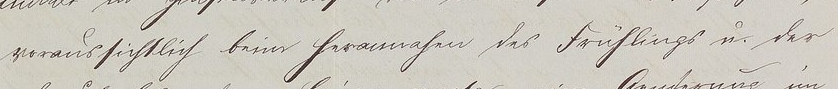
voraussichtlich beim Herannahen des Frühlings u. der
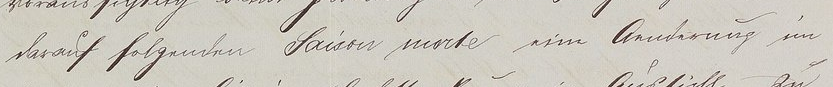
darauf folgenden Saison morte eine Aenderung im
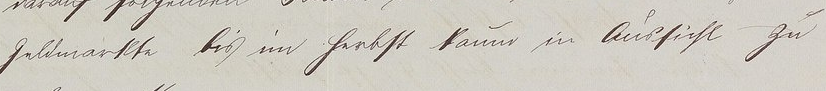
Geldmarkte bis im Herbst kaum in Aussicht zu
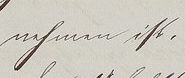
nehmen ist.
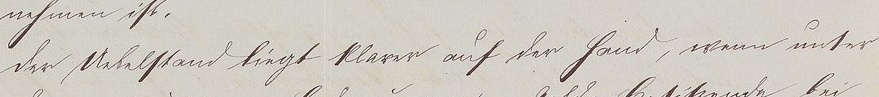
Der Uebelstand liegt klarer auf der Hand, wenn unter
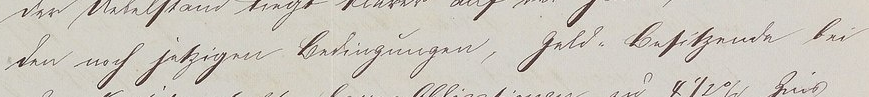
den noch jetzigen Bedingungen, Geld-Besitzende bei
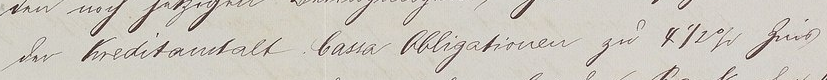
der Kreditanstalt Cassa Obligationen zu 4½% Zins
